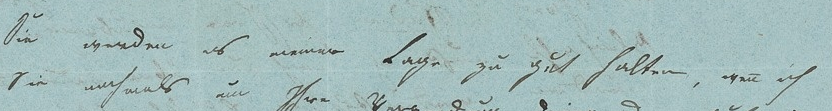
Sie werden es meiner Lage zu gut halten, wenn ich
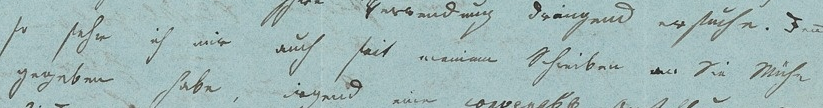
so sehr ich mir auch seit meinem Schreiben an Sie Mühe
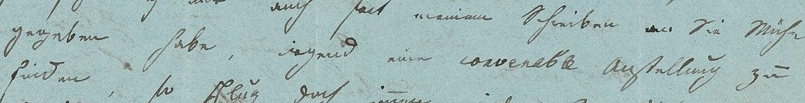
gegeben habe, irgend eine convenable Anstellung zu
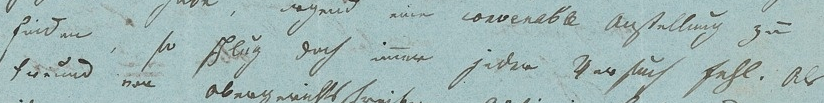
finden, so schlug doch immer jeder Versuch fehl. Als
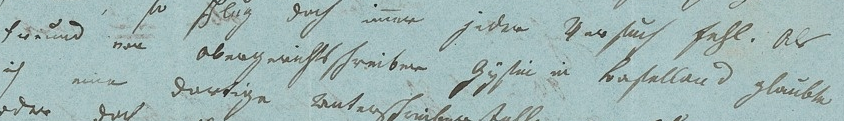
Freund von Obergerichtsschreiber Gysin in Baselland glaubte
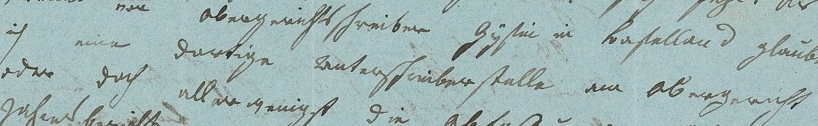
ich eine dortige Unterschreiberstelle am Obergericht
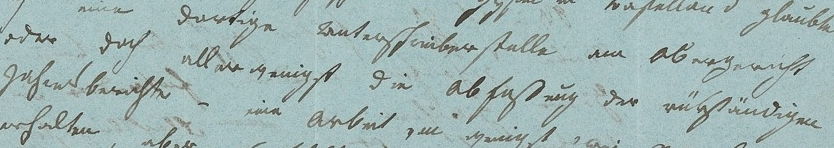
oder doch allerwenigst die Abfassung der rükständigen
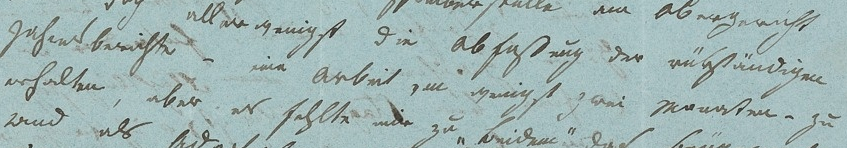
Jahresberichte – eine Arbeit von wenigst zwei Monaten – zu
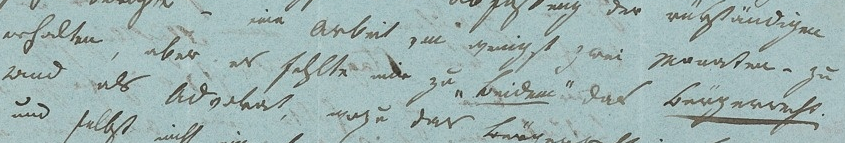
erhalten, aber es fehlte mir zu «Beidem» das Bürgerrecht.
